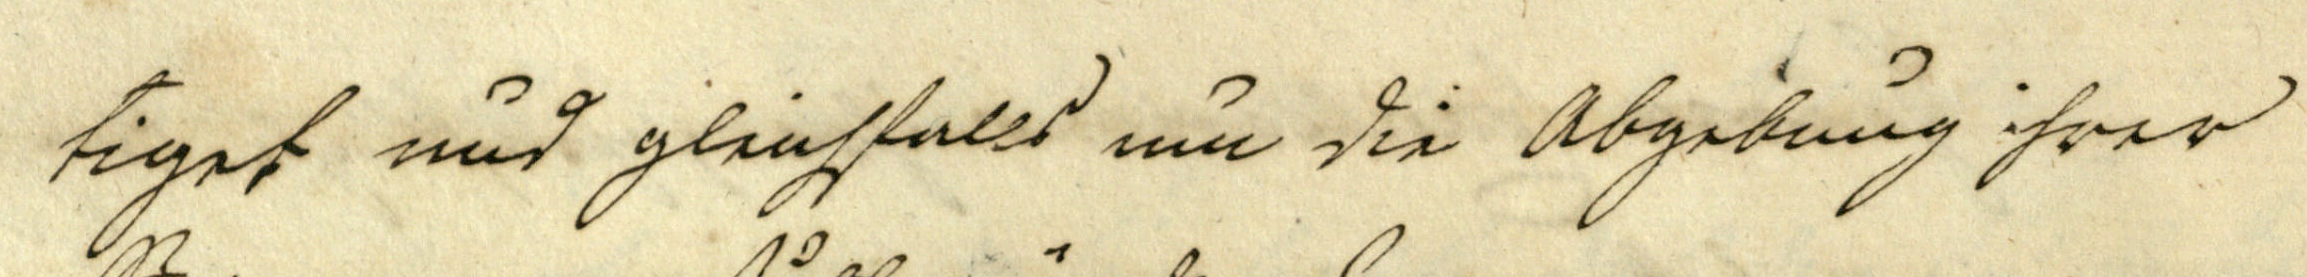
tiget und gleichfalls um die Abgebung ihrer
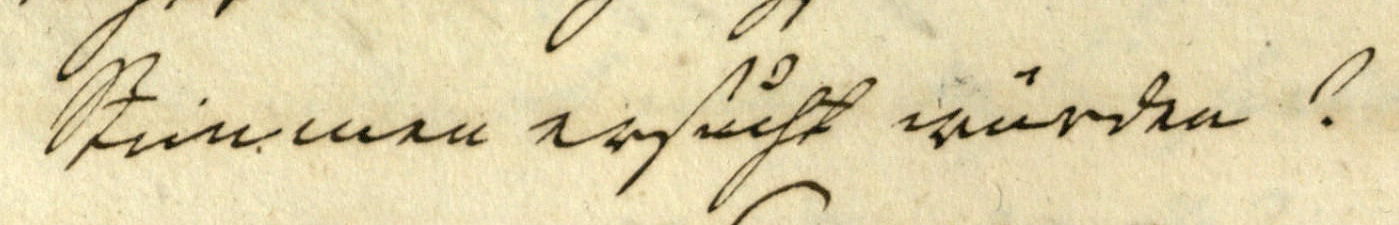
Stimmen ersucht würden?
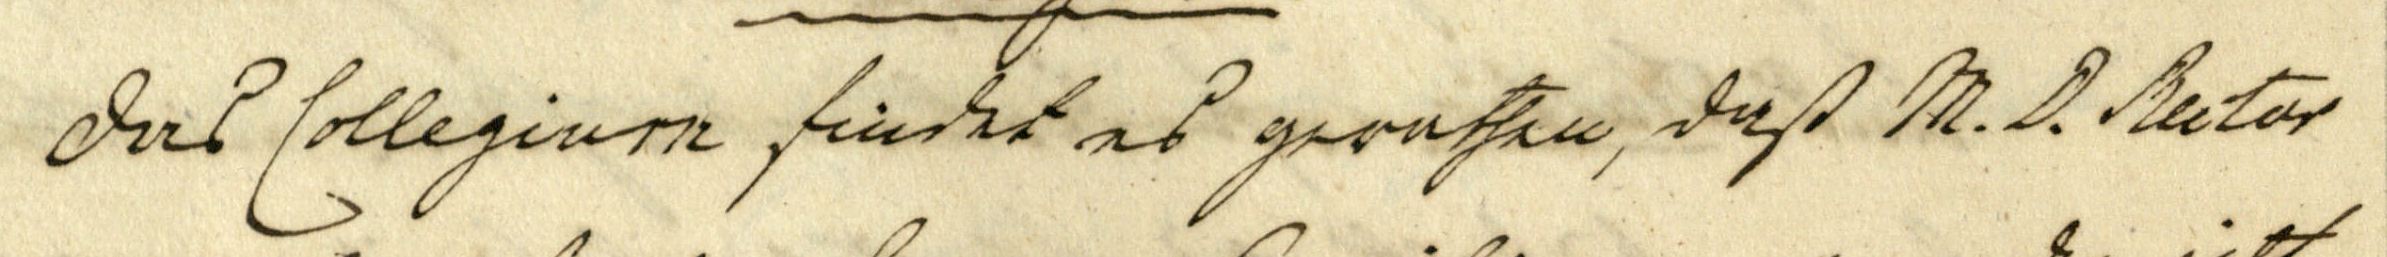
Das Collegium findet es gerathen, daß M. D. Rector
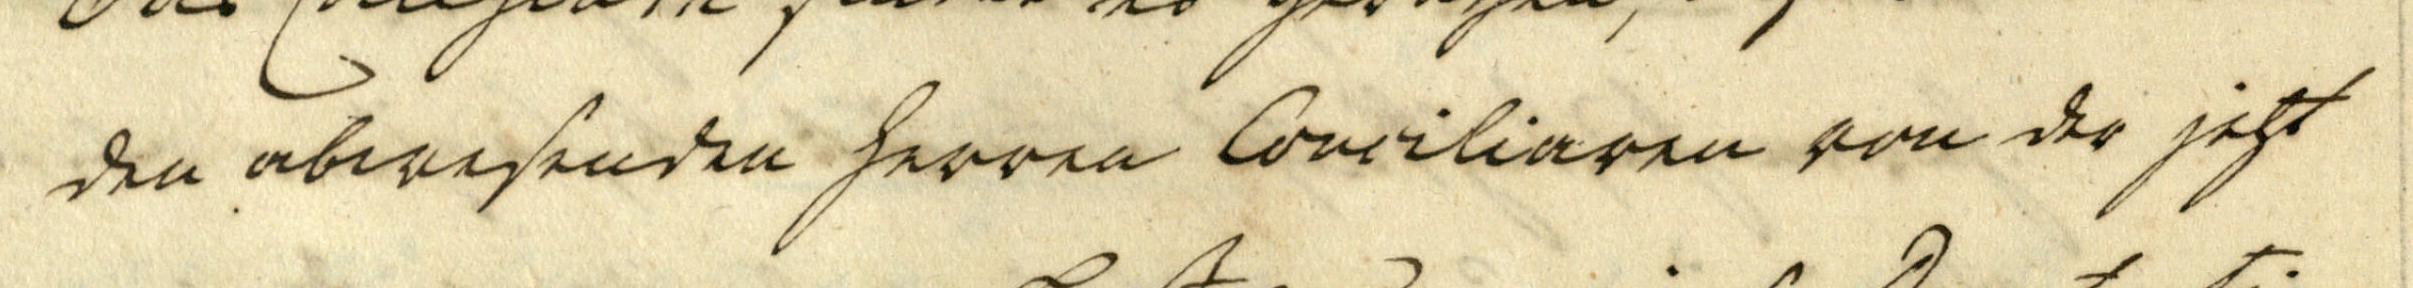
den abwesenden Herren Conciliaren von der jetzt
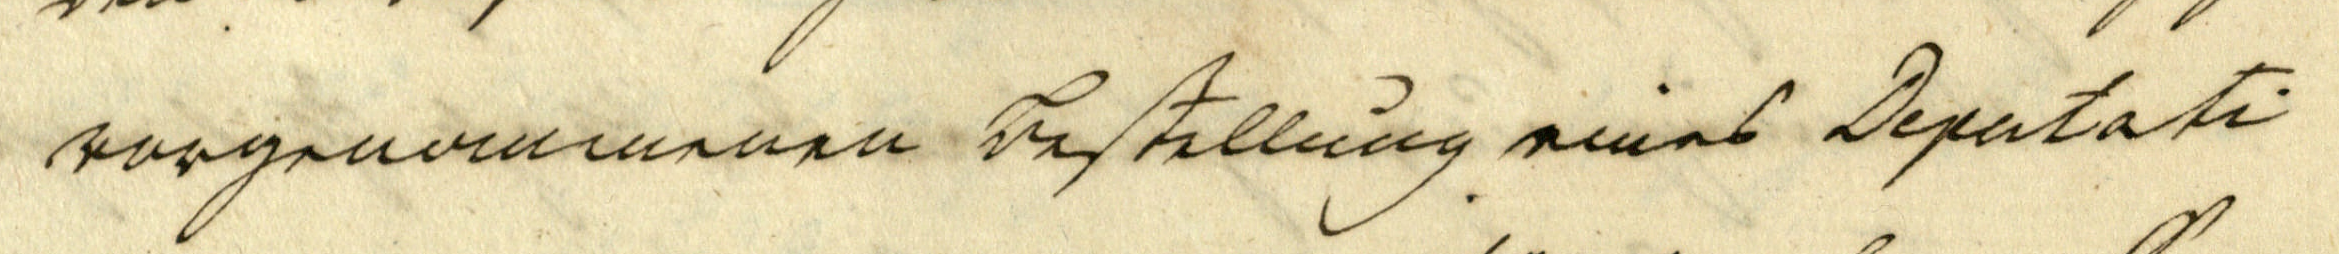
vorgenommenen Bestellung eines Deputati
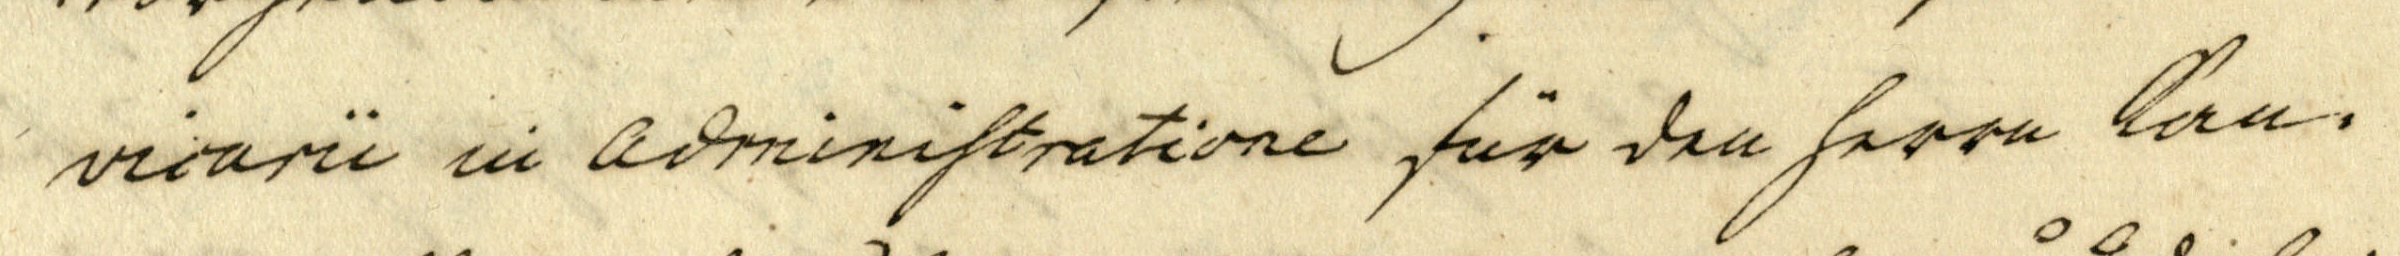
vicarii in Administratione für den Herrn Kan¬
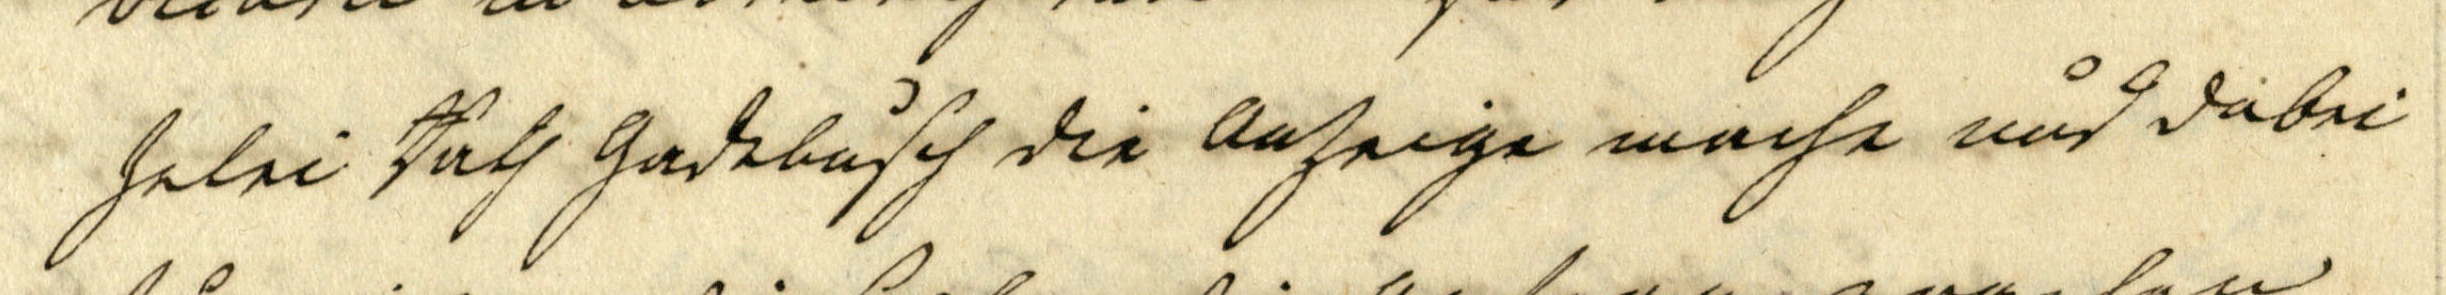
zelei Rath Gadebusch die Anzeige mache und dabei
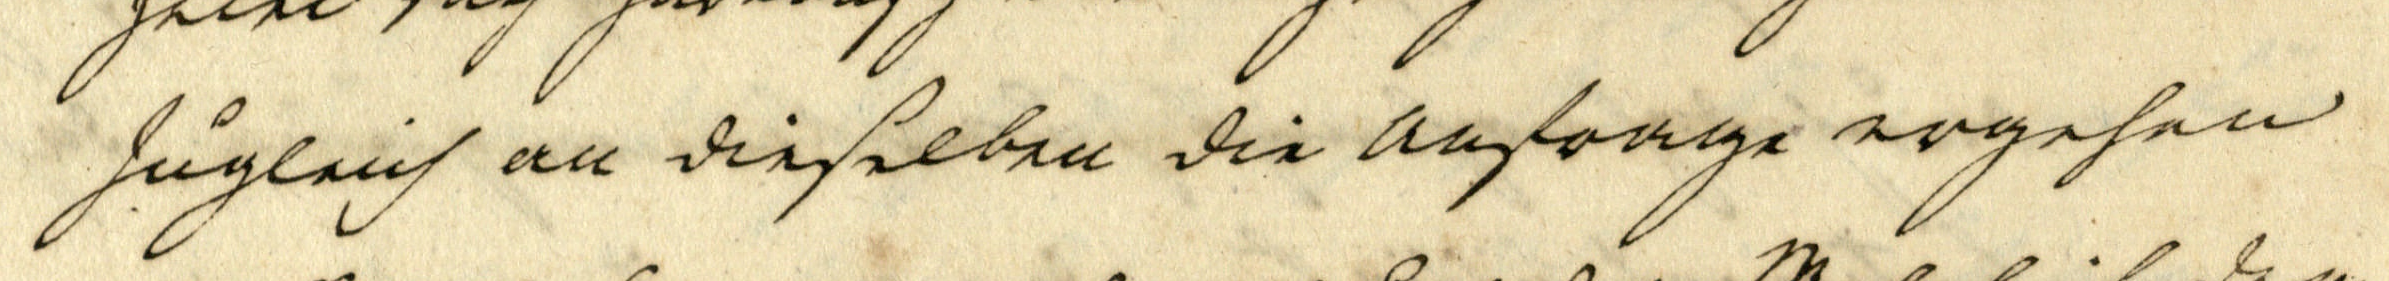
zugleich an dieselben die Anfrage ergehen
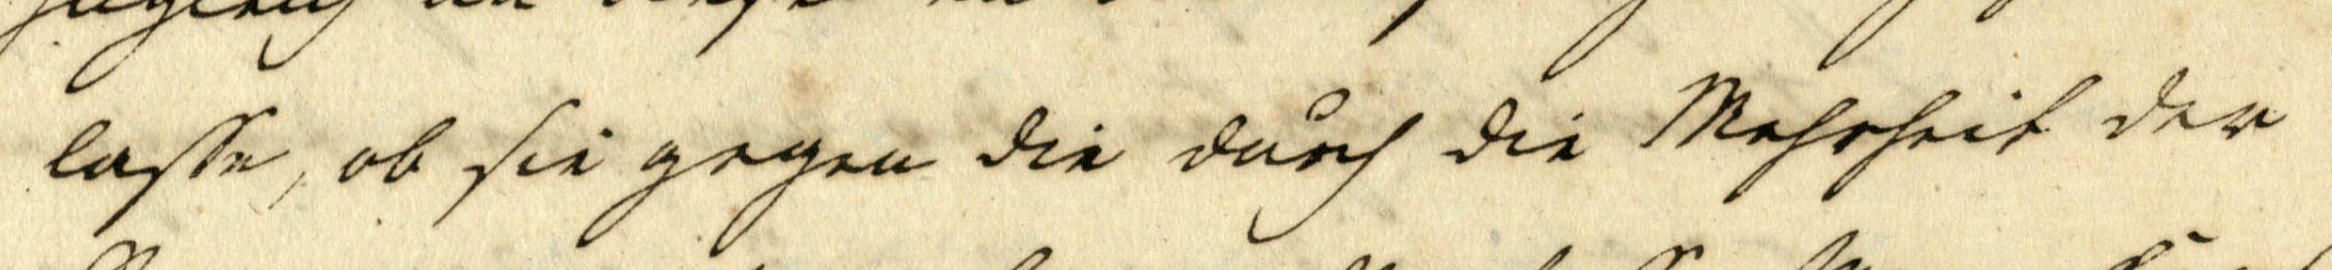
lasse, ob sie gegen die durch die Mehrheit der
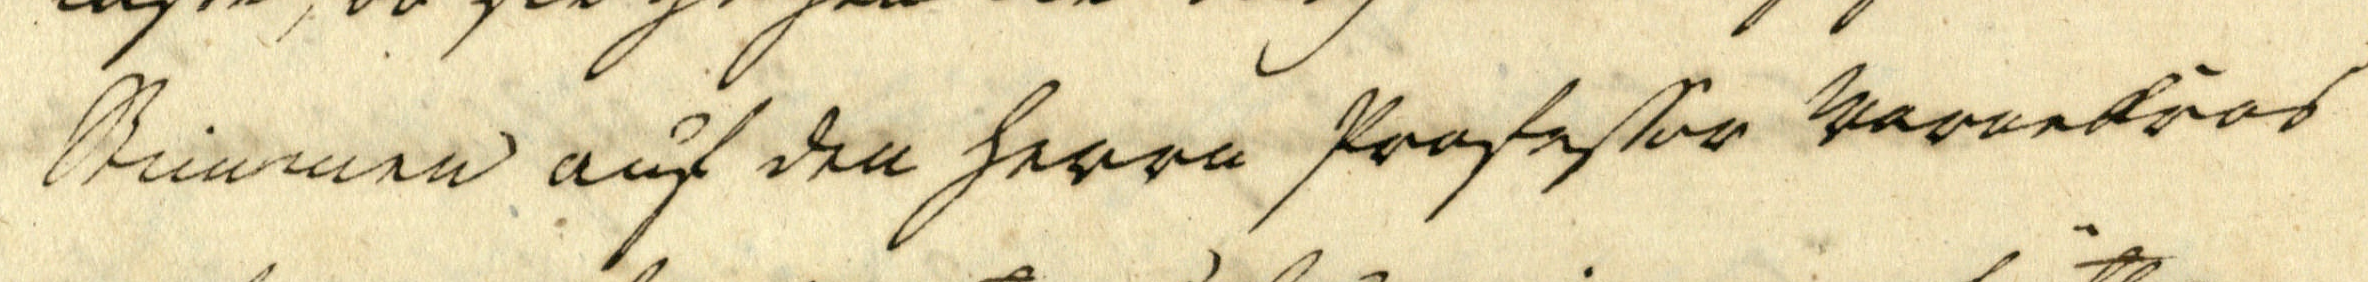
Stimmen auf den Herrn Professor Warnekros
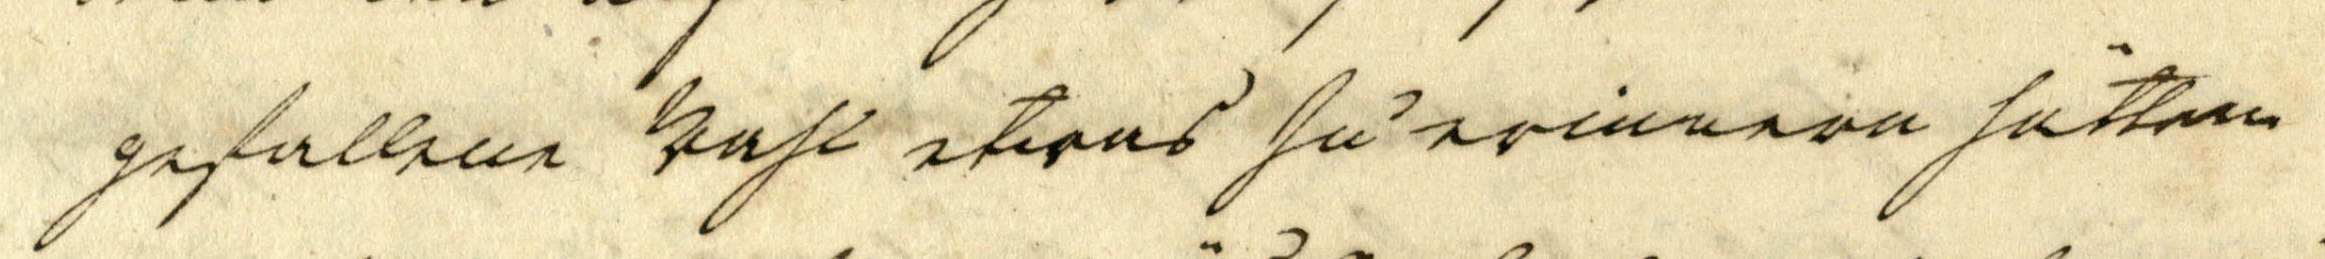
gefallene Wahl etwas zu erinnern hätten.
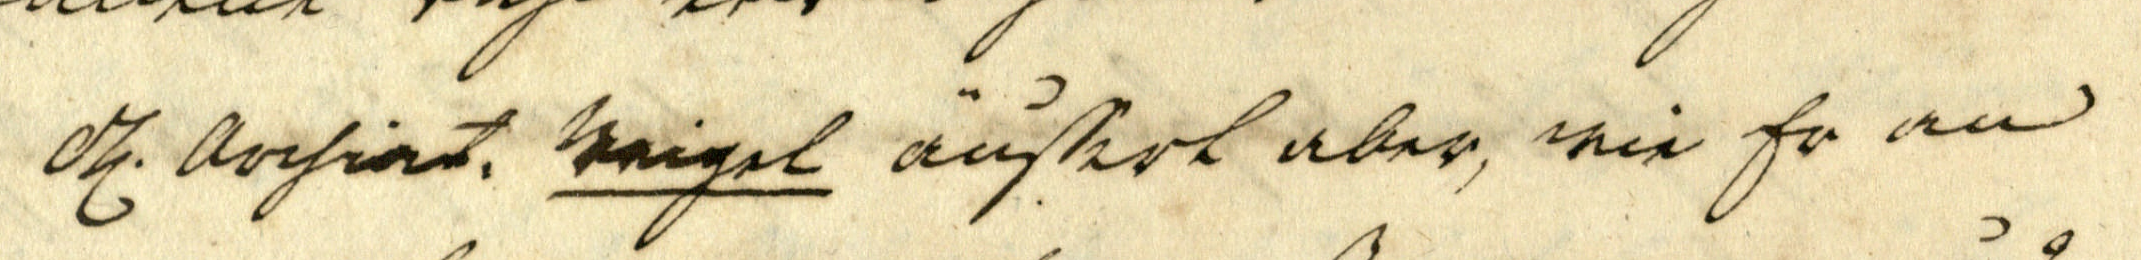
dh. Archiat. Weigel äussert aber, wie Er an
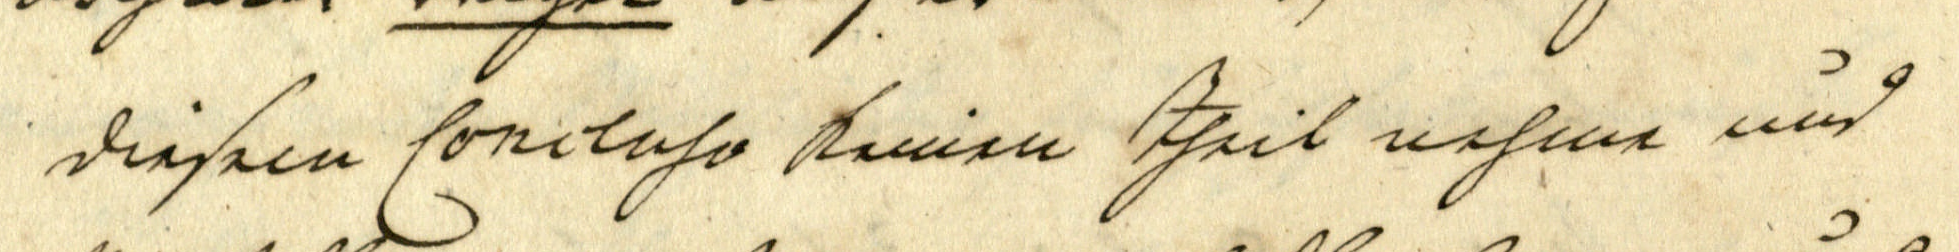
diesem Concluso keinen Theil nehme und
